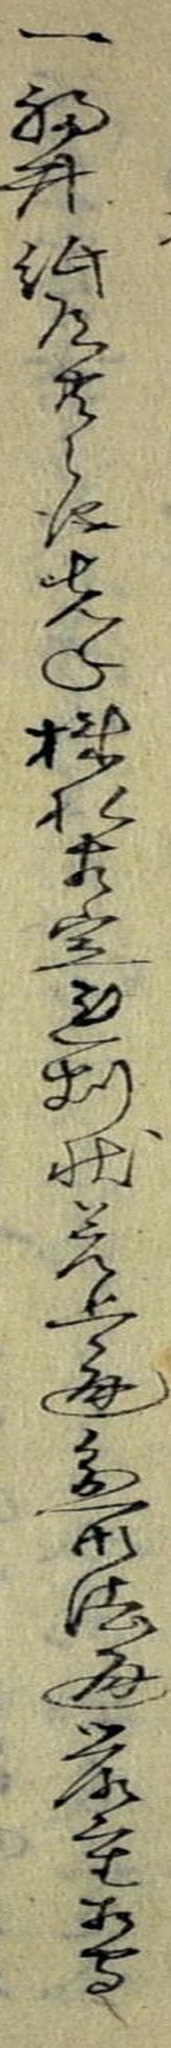一福井紙屋共之儀先年株札相定連判状差上之通愈御法通厳重相守
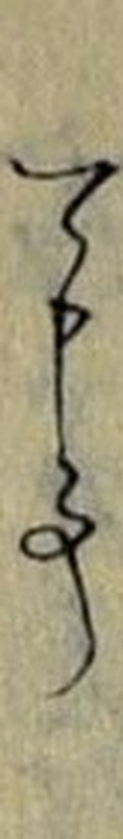可申事
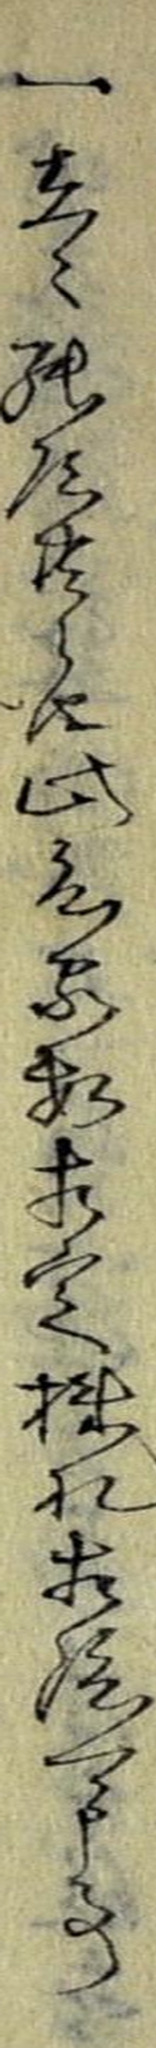一在々紙屋共之儀此度家数相定株札相渡可申事
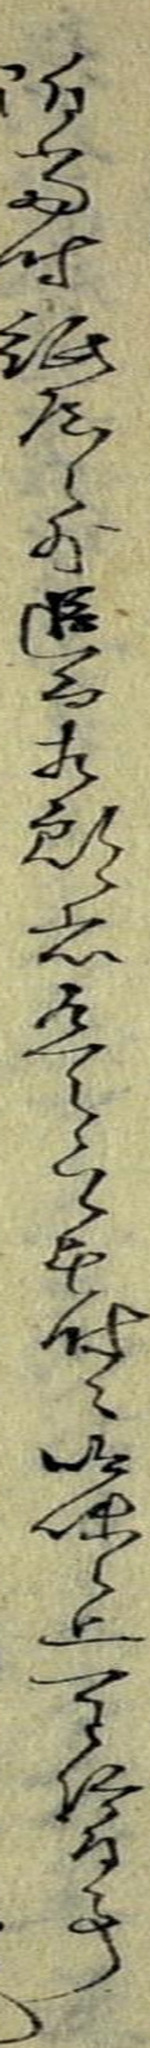附当時紙屋之外追而相願候者有之候ハヽ其時ニ吟味之上可被仰付事
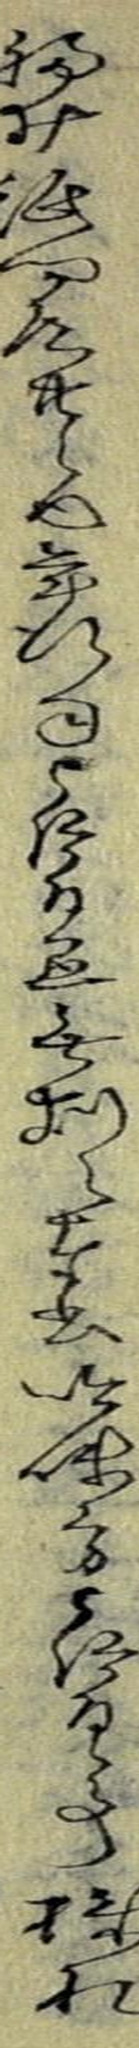一福井紙問屋共之内年行司被仰付置無判之奉書吟味方被仰付候事株札
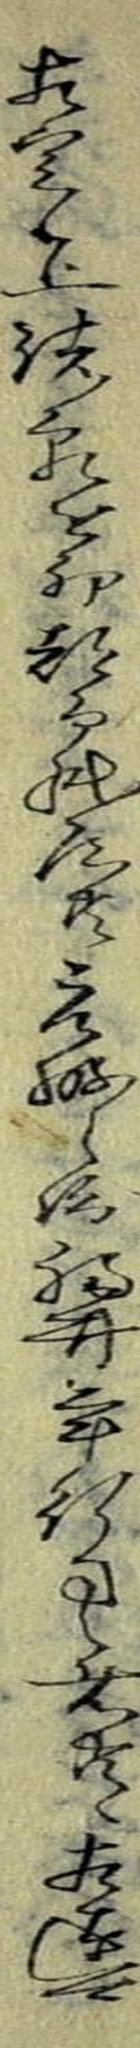相定之上諸願を初都而紙屋共取扱之儀福井年行司之者共へ相達可
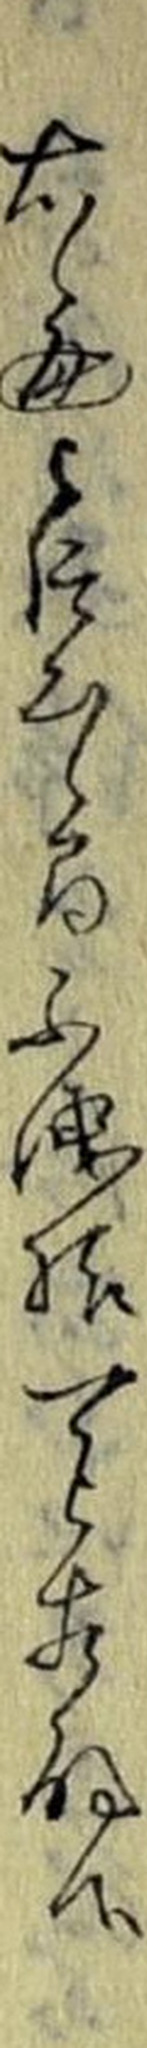右之通被仰出候間不洩様可被相触候
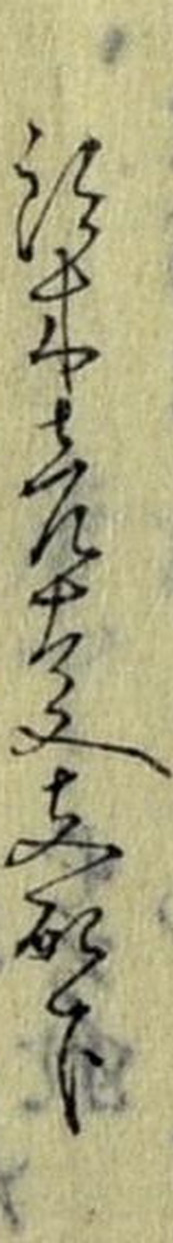鈴木彦大夫支配下
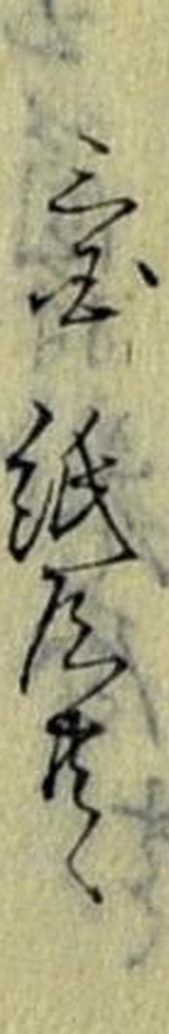三国紙屋共へ
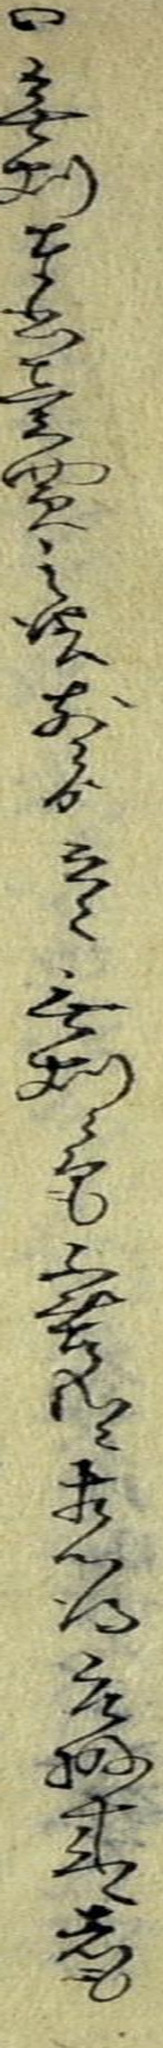○無判奉書売買之儀ハ前々ゟ云々無判ニ而も不苦哉ニ相心得取扱来候者も
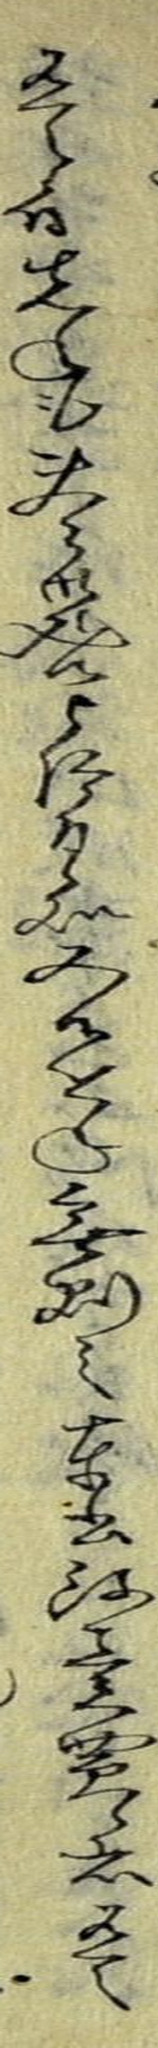有之ニ付先年も夫々御咎被申付候処又々近年無判之奉書致売買候者有之
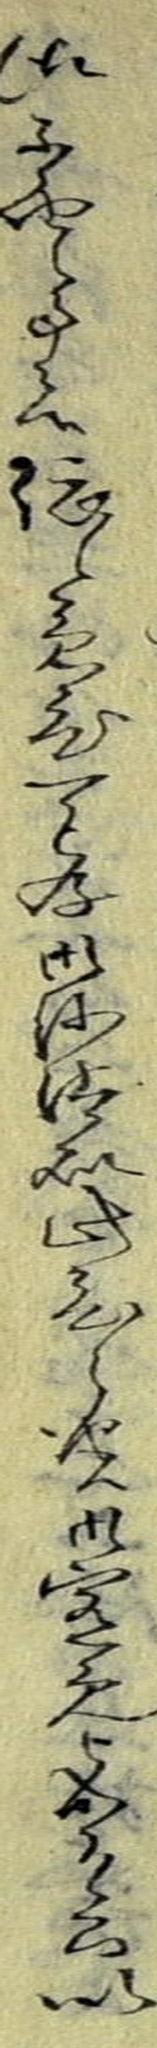趣不届之事ニ候依之急度可被存御沙汰候処此度之儀ハ御宥免被成下候間以
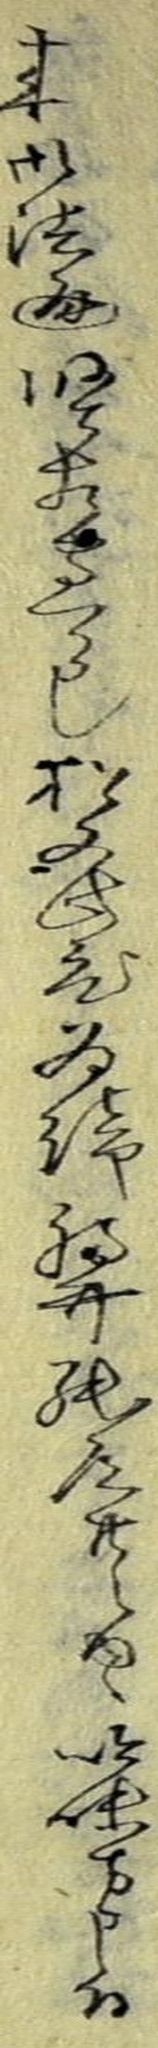来御法通堅相守可申候猶又此度為締福井紙屋共之内吟味方申付

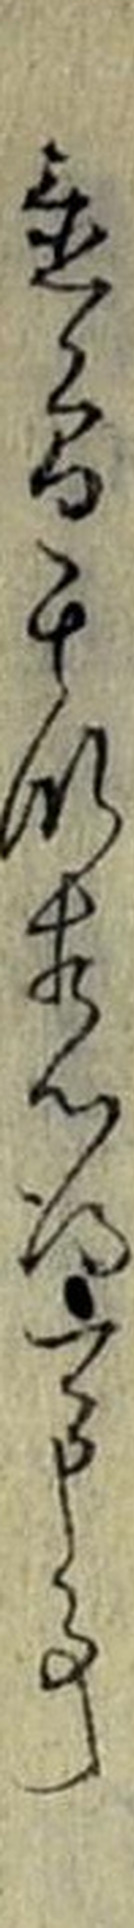置候其段相心得可申事
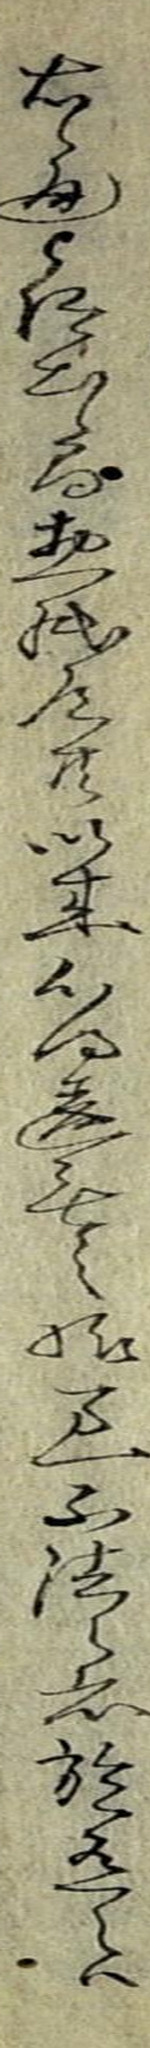右之通被仰出候間惣紙屋共以来心得違無之様万一不法之者於有之ハ
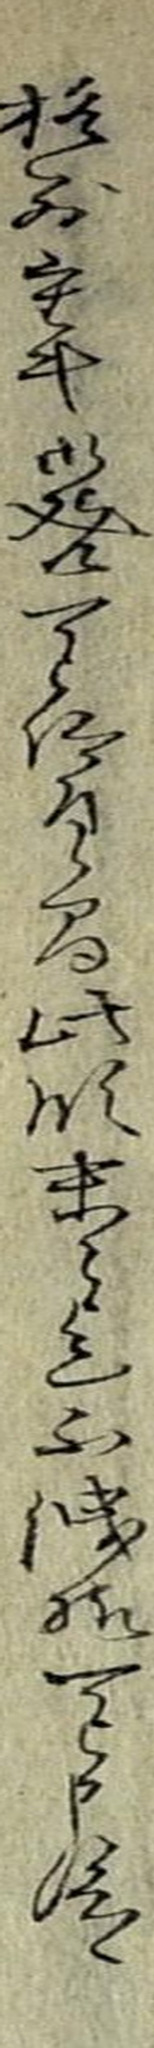格別重キ御咎可被仰付候間此段末々迄不洩様可被申渡候
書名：命令之部 五
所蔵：福井県文書館 Fukui Prefectural Archives
